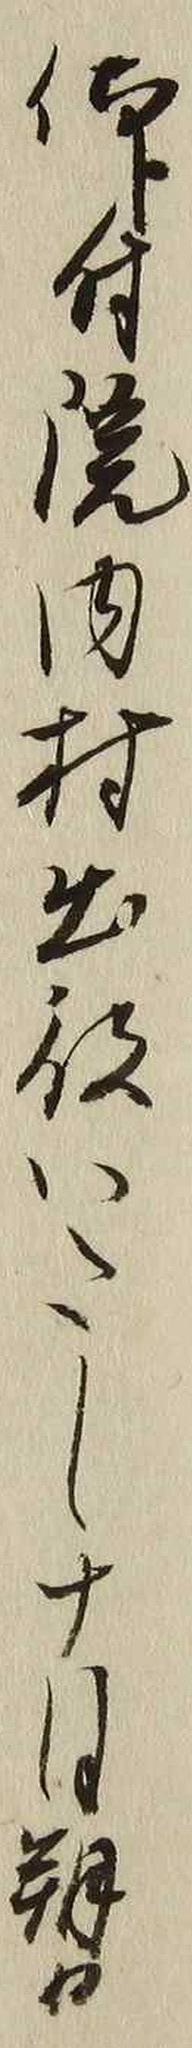仰付院内村出役いたし十月朔日
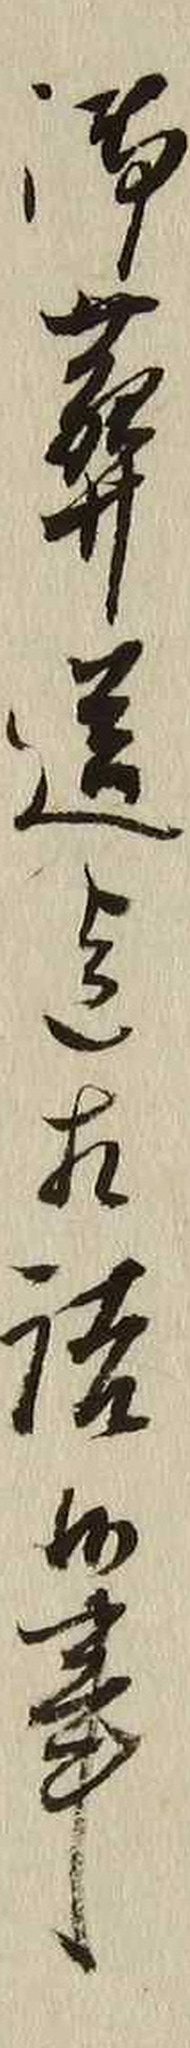御葬送迄相詰候事
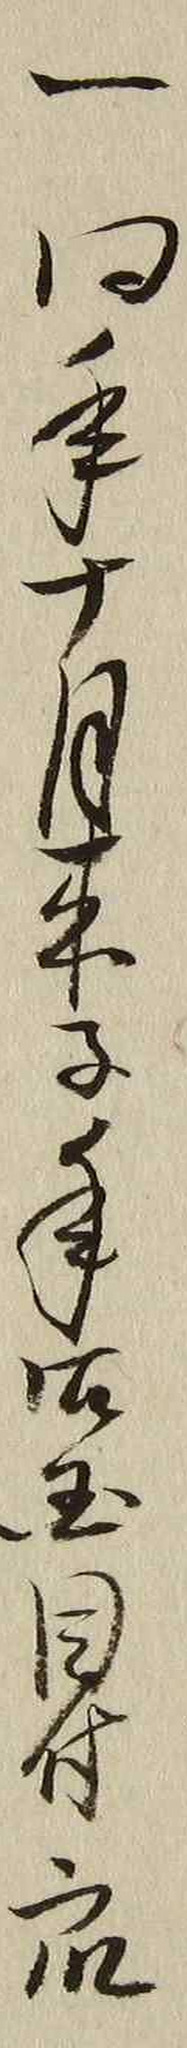一同年十月来子年御国目付衆
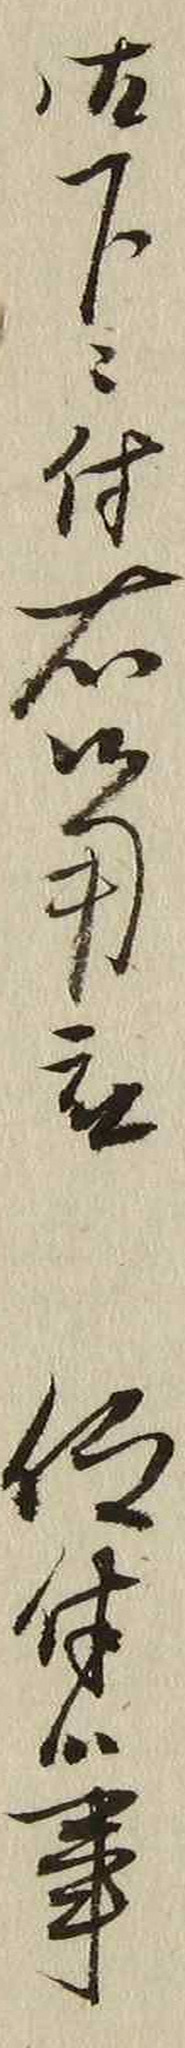御下ニ付右御用被仰付候事
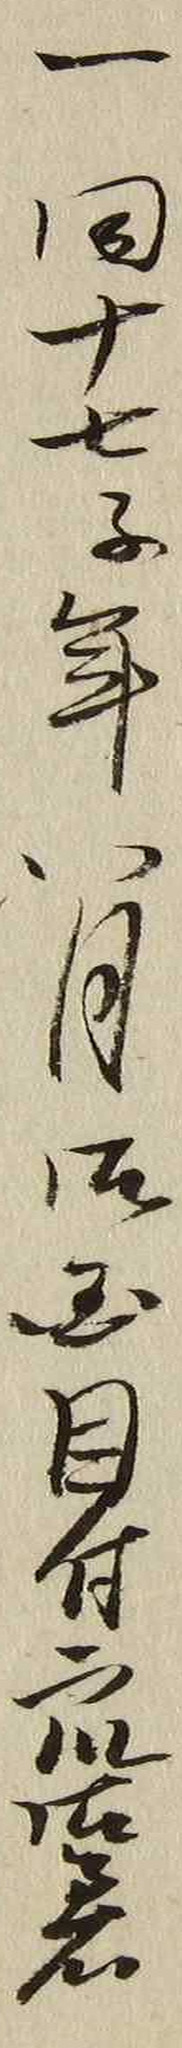一同十七子年八月御国目付衆御着
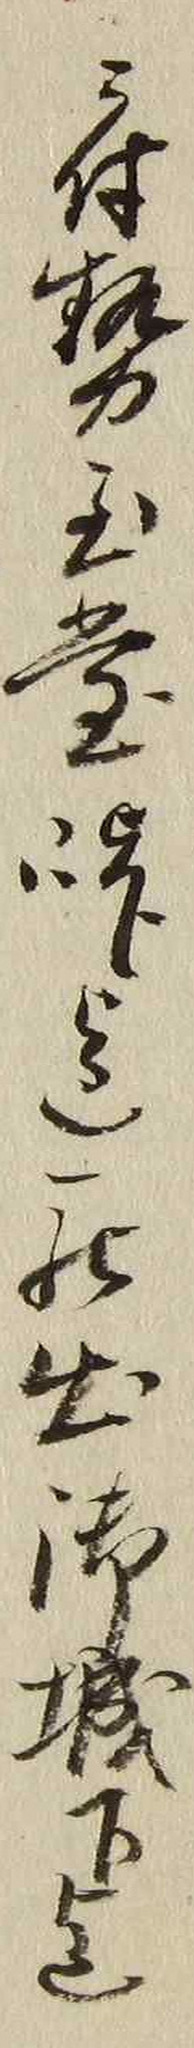ニ付勢至堂峠迄罷出御城下迄
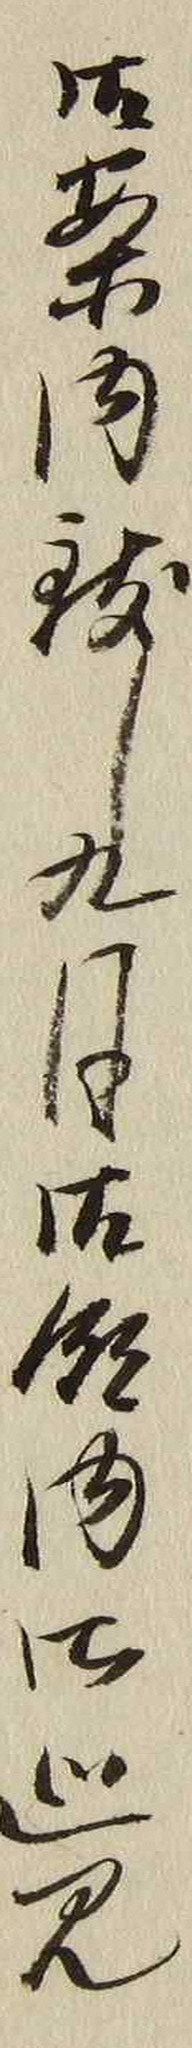御案内致し九月御領内御巡見
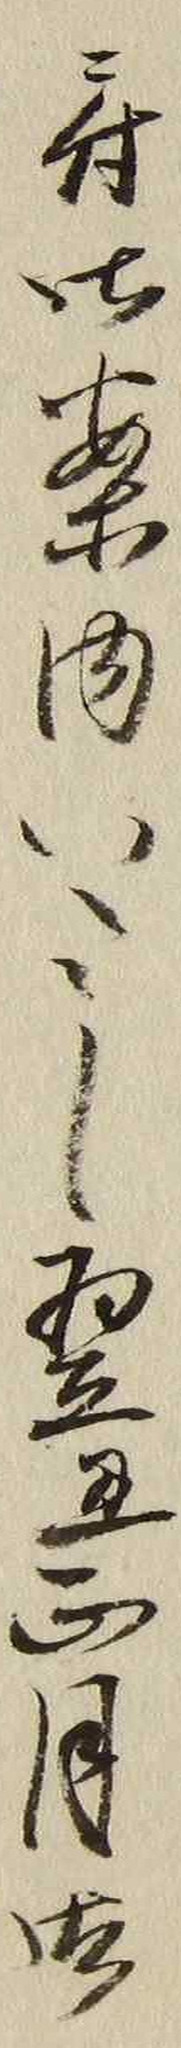ニ付御案内いたし翌丑正月御
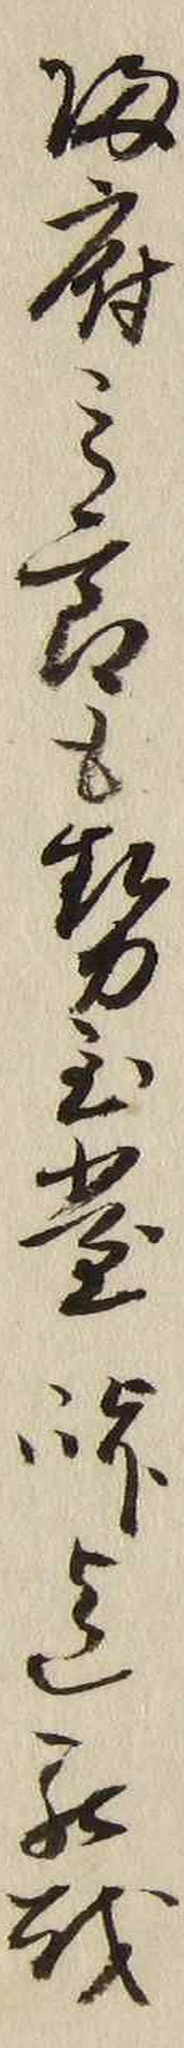帰府之節も勢至堂峠迄罷越

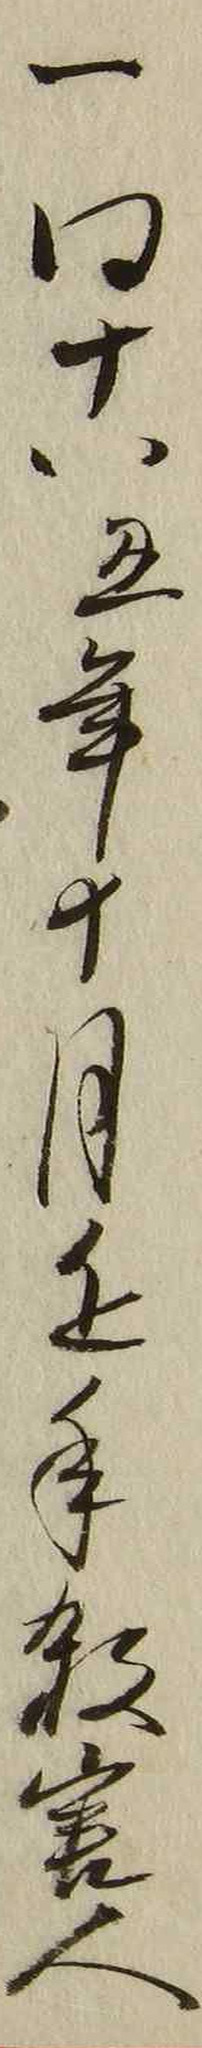一同十八丑年十月近年殺害人
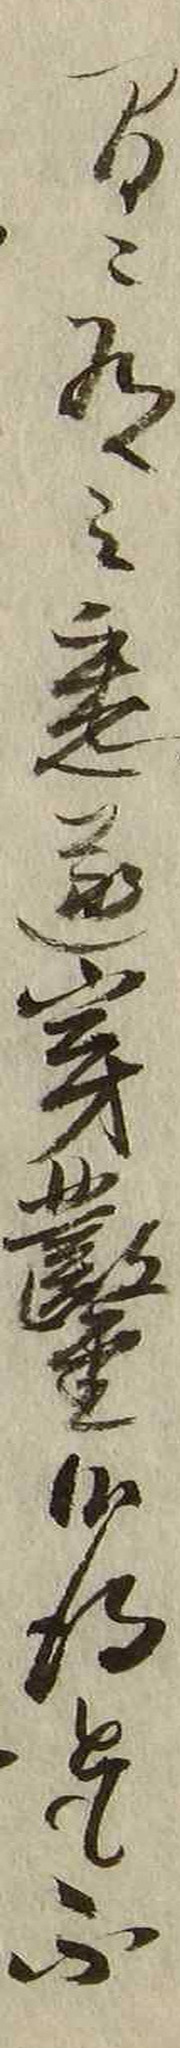間々有之悉遂穿鑿候得とも不
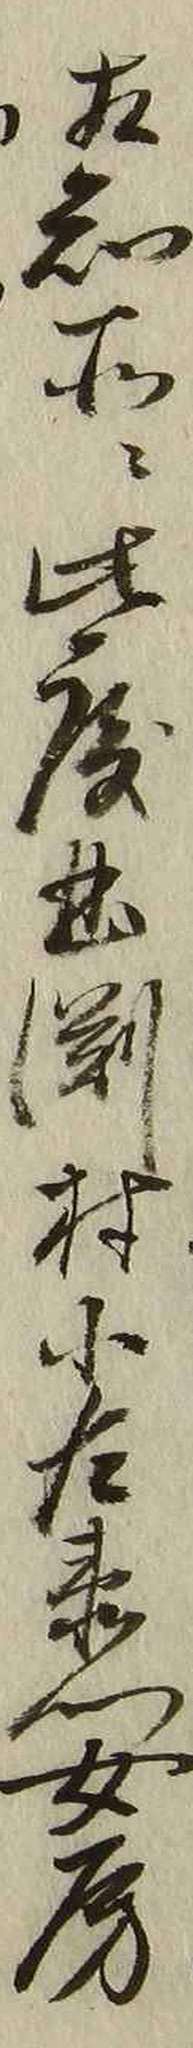相知所ニ此度曲淵村小左衛門女房
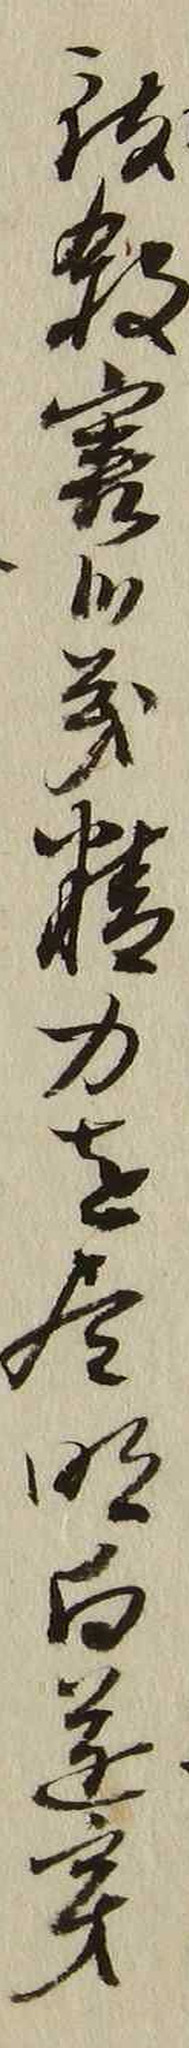致殺害候義精力を尽明白遂穿
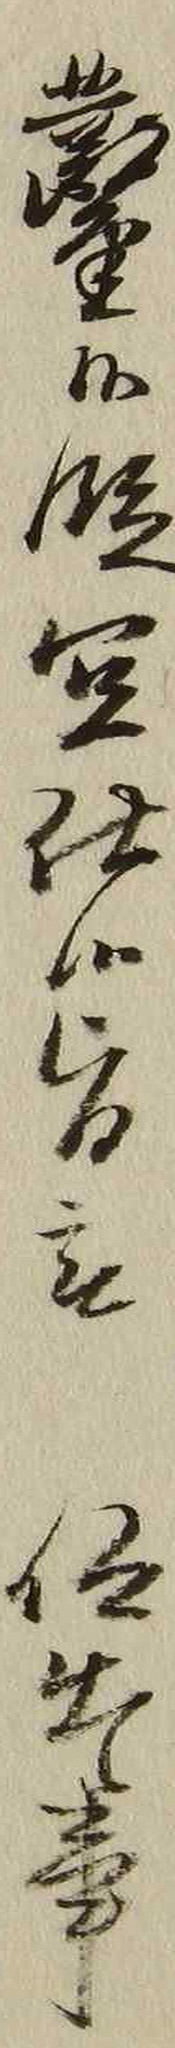鑿候段宜仕候旨被仰出候事
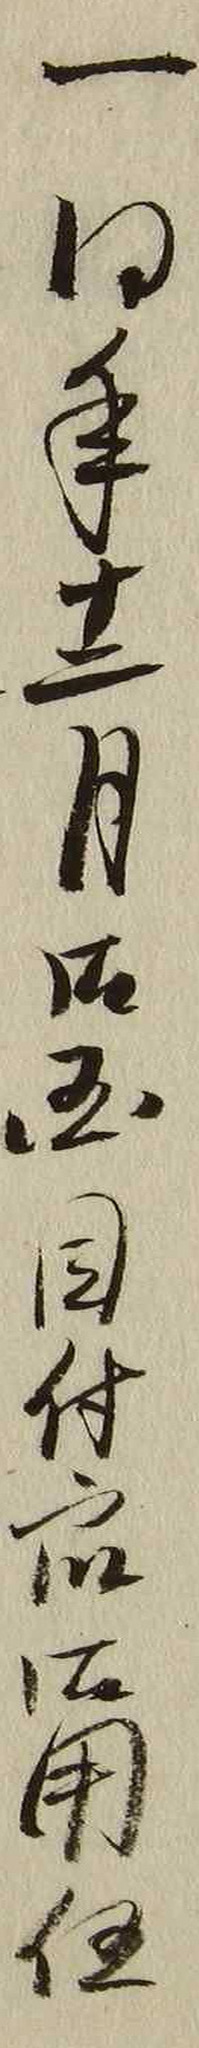一同年十二月御国目付衆御用任
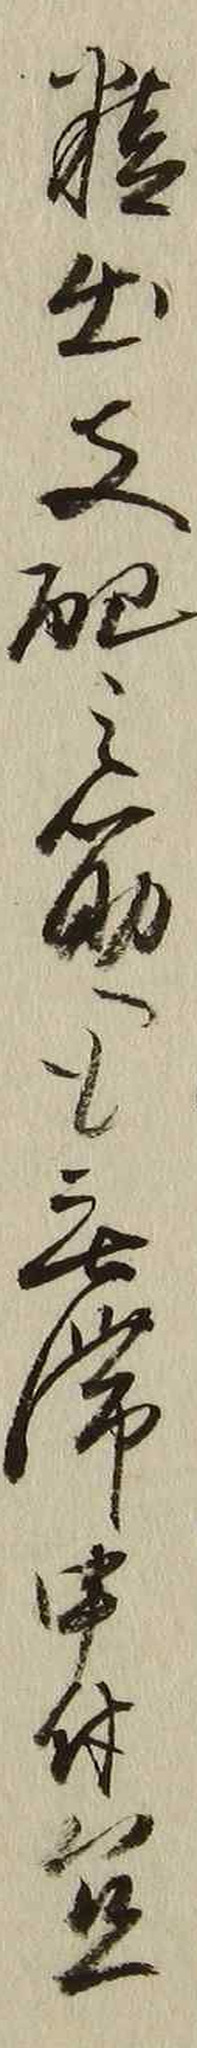精出支配之筋へも無滞申付宜
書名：諸士系譜　巻之352　す之部2
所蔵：会津若松市立会津図書館
